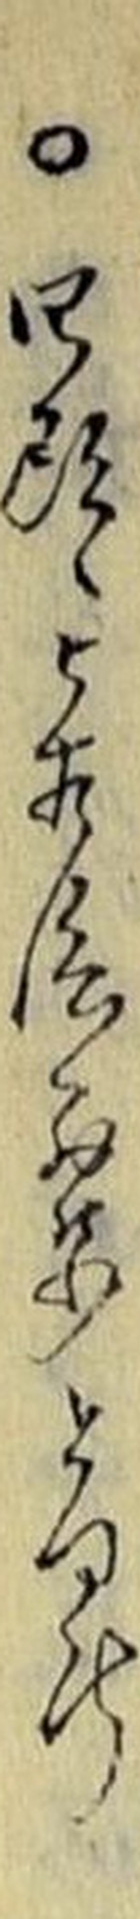○四郡へ被相渡別紙と同断
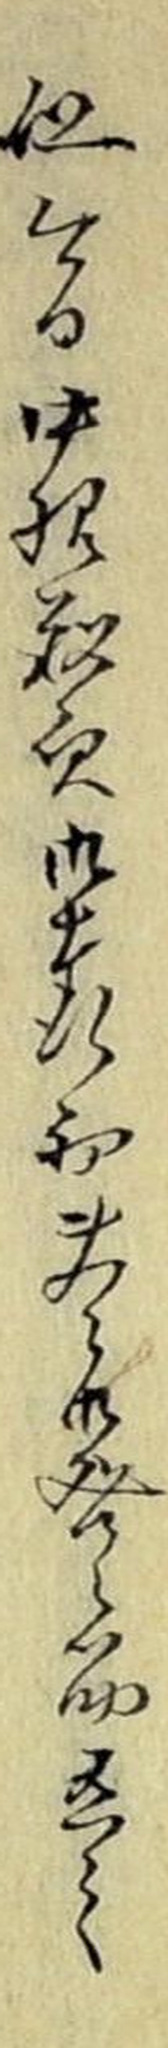但今日中根靭負御奉行初夫々御咎之筋有之
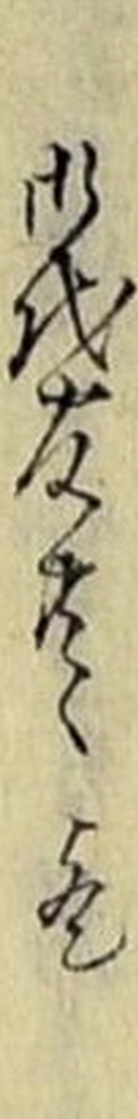御代官共へ歟
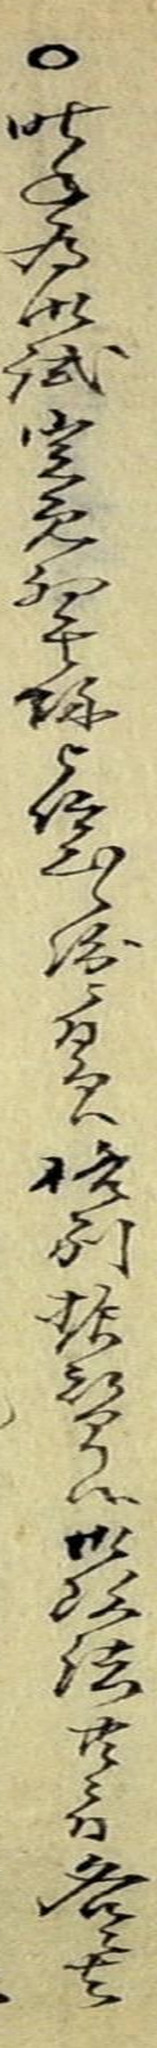○昨年為御試定免初其餘被仰出候儀に付而は格別振替り候御趣法共に付各々は
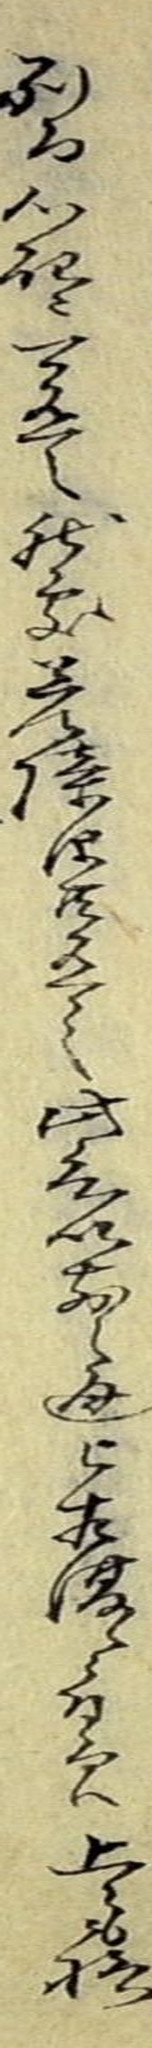別而心配可有之然処差障儀共有之此度以前之通被相復候に付而は上にも格
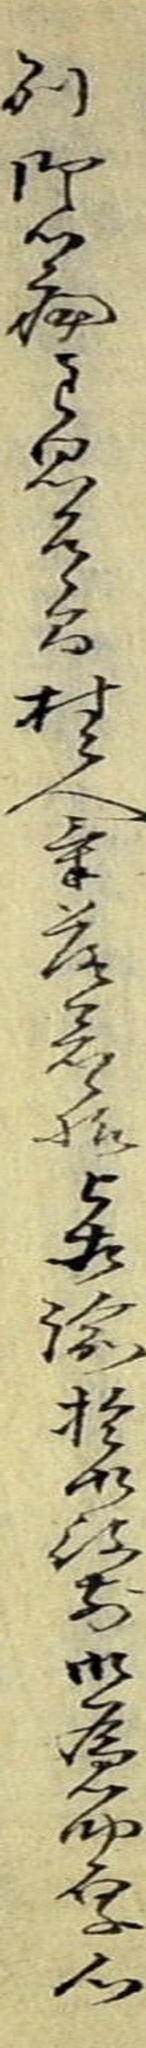別御心痛に被思召候間村々人気落着候様被相諭於御役前御為筋厚心
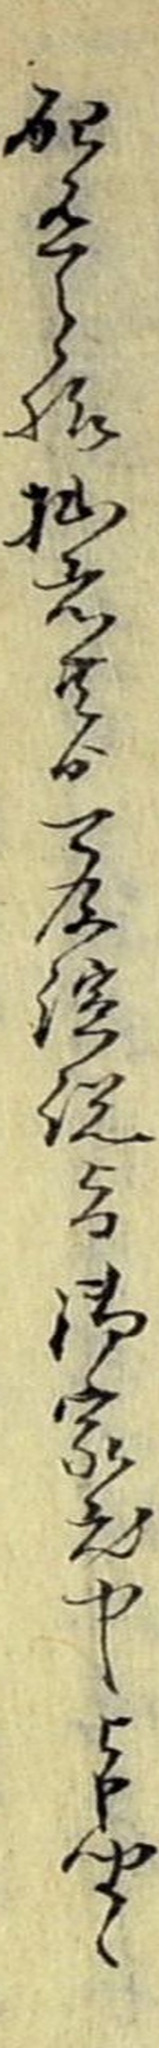配有之候様拙者共ゟ可及演説旨御家老中被申聞候
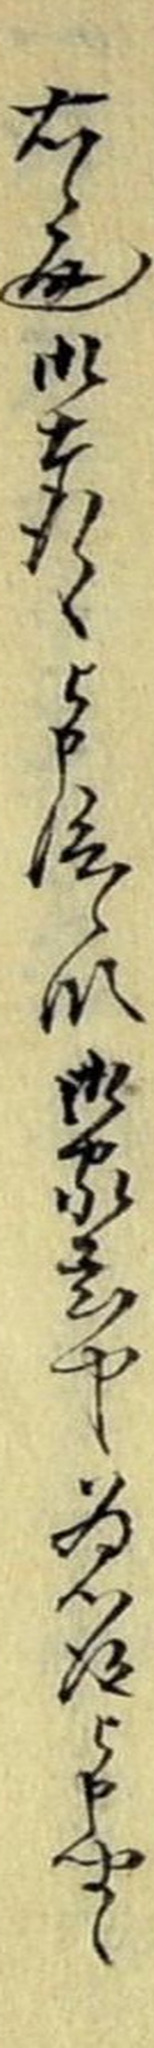右之通御奉行へ被申渡候段御家老中為心得被申聞候

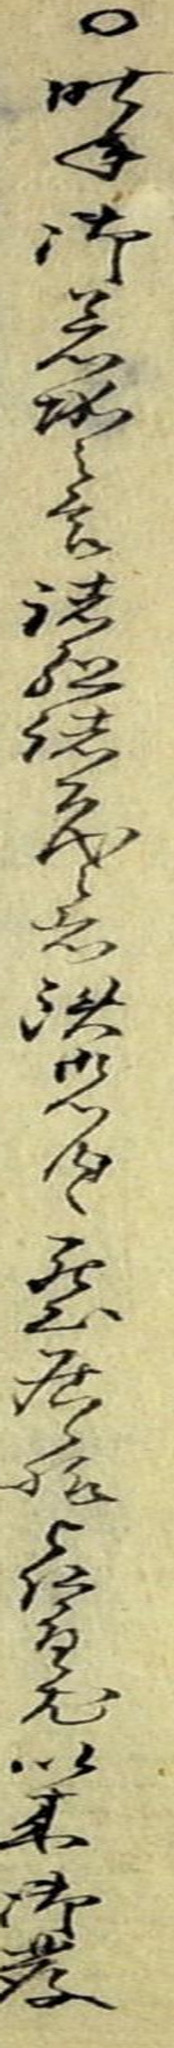○昨年御着城之節諸組諸下代之者鉄御門内へ罷出居候様被仰付候尤以來御発
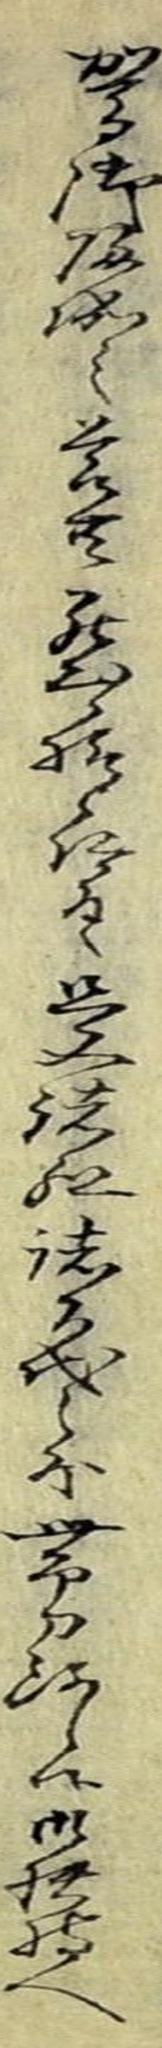駕御帰城之節共罷出候様被仰付候且又諸組諸下代之外帯刀致し候御扶持人
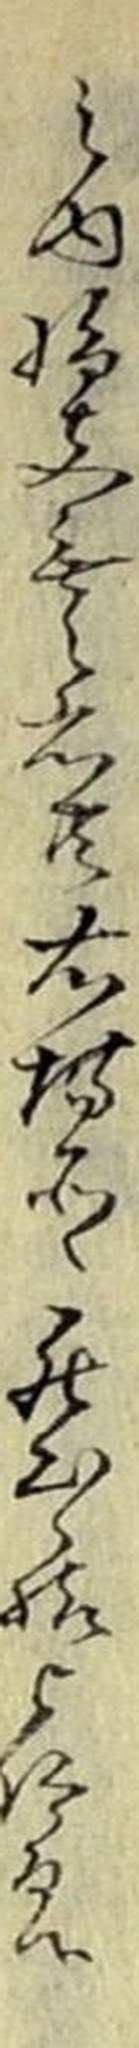之内指支無之者右場所へ罷出候様被仰附候
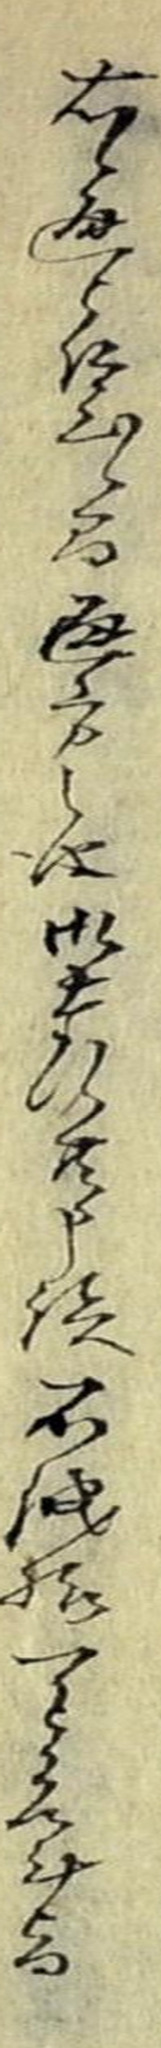右之通被仰出候間通方之儀御奉行共申談不洩様可被取斗旨
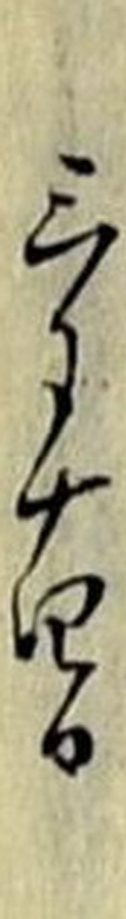三月十四日
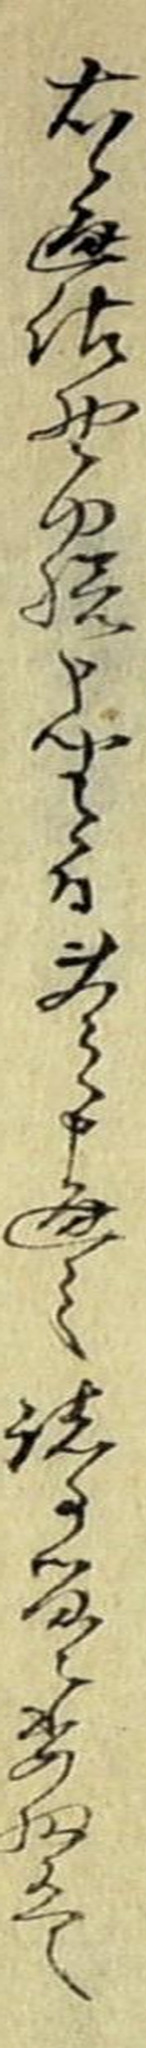右之通佐野内膳申聞候に付夫々申通之諸事留に委細有之
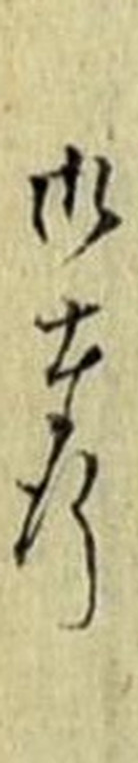御奉行
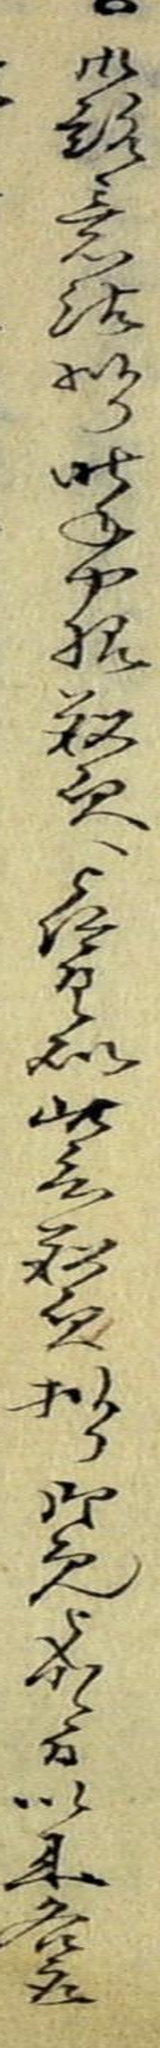○御趣意銀掛り昨年中根靭負へ被仰付候処此度靭負掛り御免被成候に付以來各取
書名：命令之部 六
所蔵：福井県文書館 Fukui Prefectural Archives
